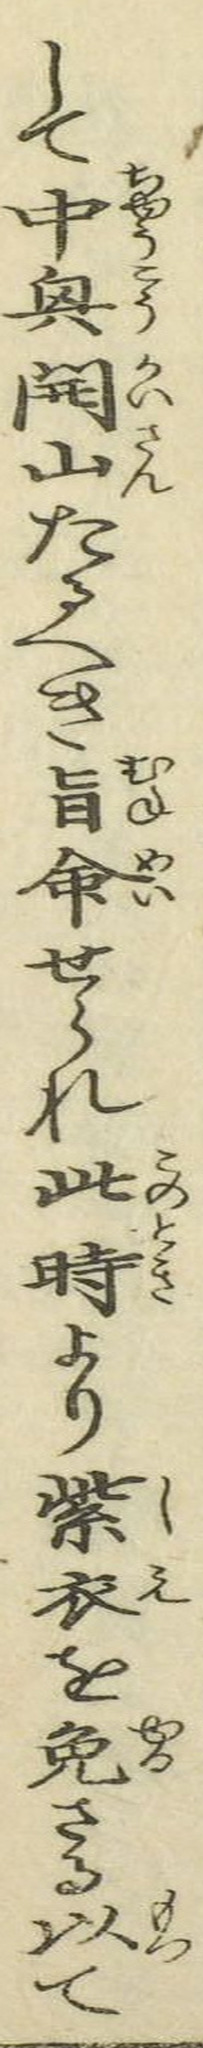して中興開山たるへき旨命せられ此時より紫衣を免さる以て
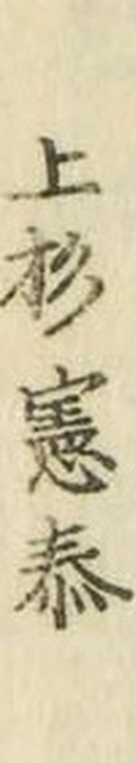上杉憲泰
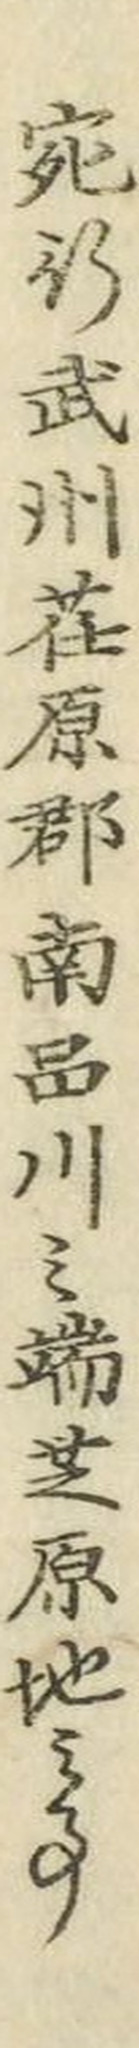宛所武州荏原郡南品川之端芝原地之事
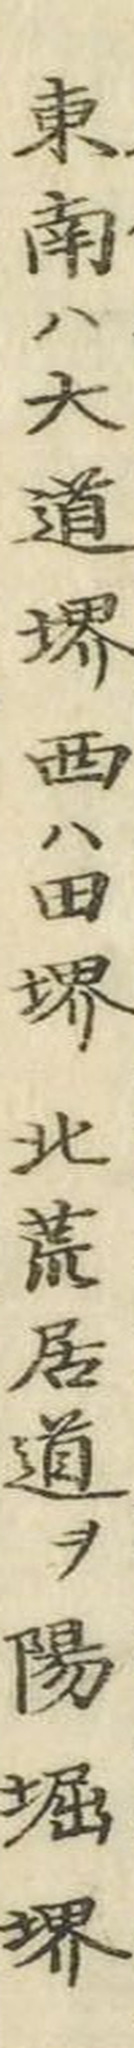東南ハ大道堺西ハ田堺北荒居道ヲ陽堀堺
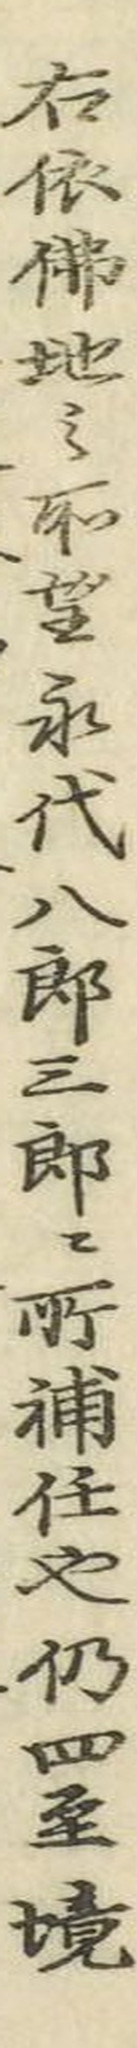右依佛地之所望永代八郎三郎ニ所補任也仍四至境
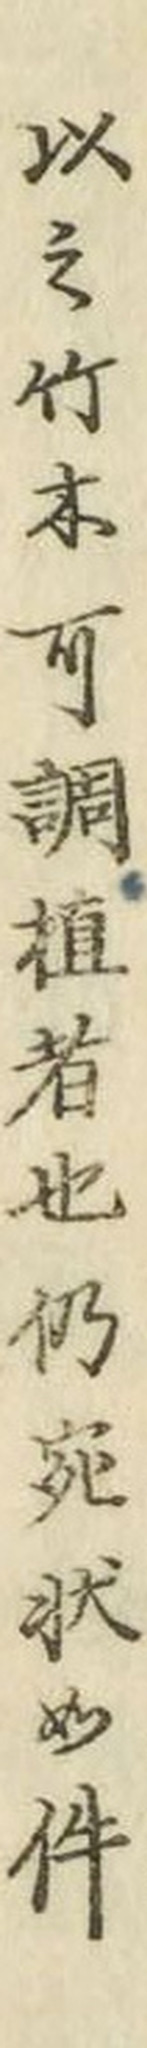以之竹木可調植者也仍宛状如件
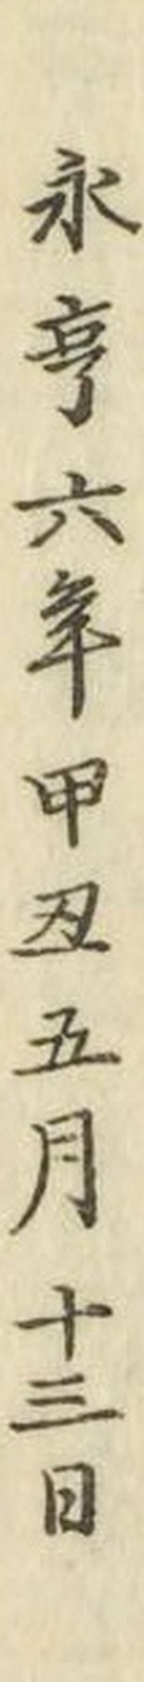永亨六年甲丑五月十三日
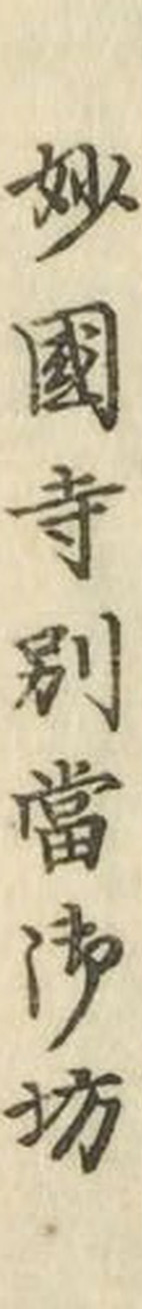妙國寺別當御坊
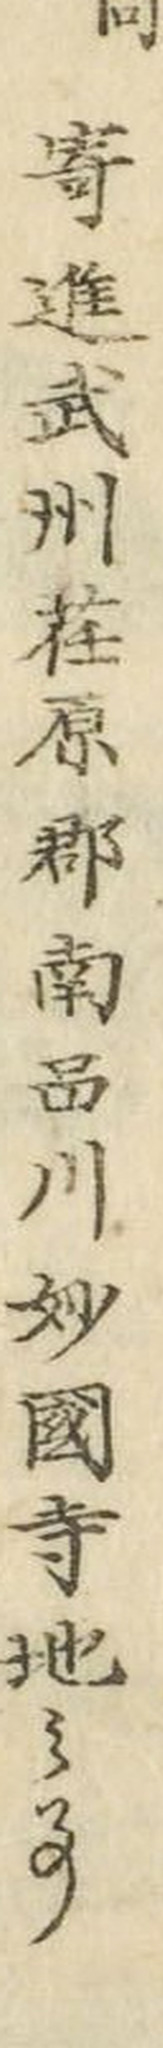同寄進武州荏原郡南品川妙國寺地之事
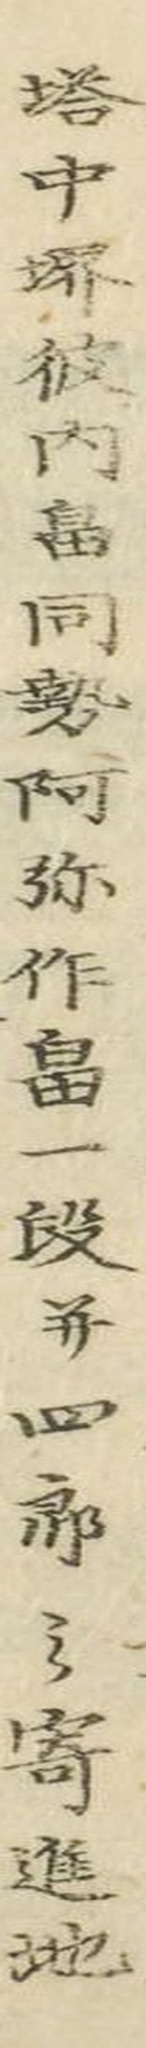塔中堺彼内畠同勢阿弥作畠一段幷四郎之寄進地
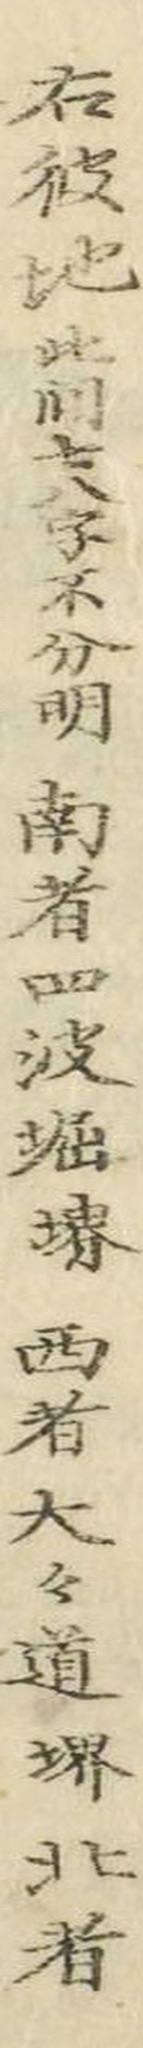右彼地此間七八字不分明南者四波堀堺西者大々道堺北者
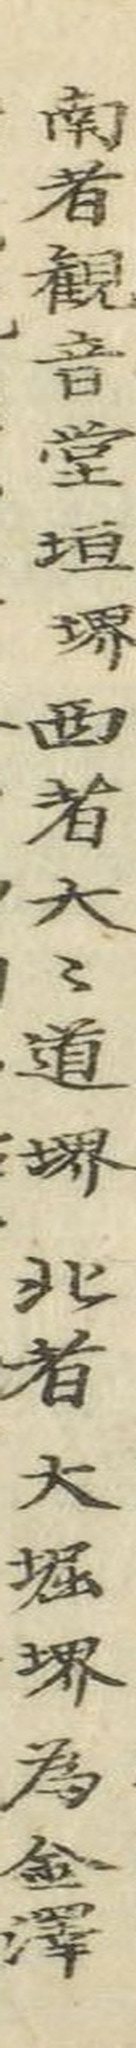南者観音堂垣堺西者大々道堺北者大堀堺為金澤
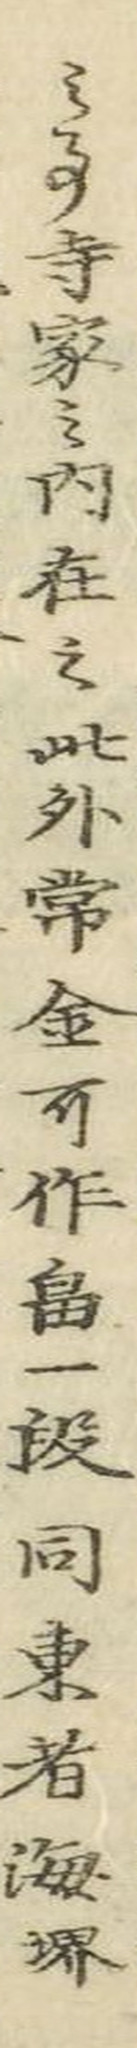之事寺家之内在之此外常金可作畠一段同東者海堺
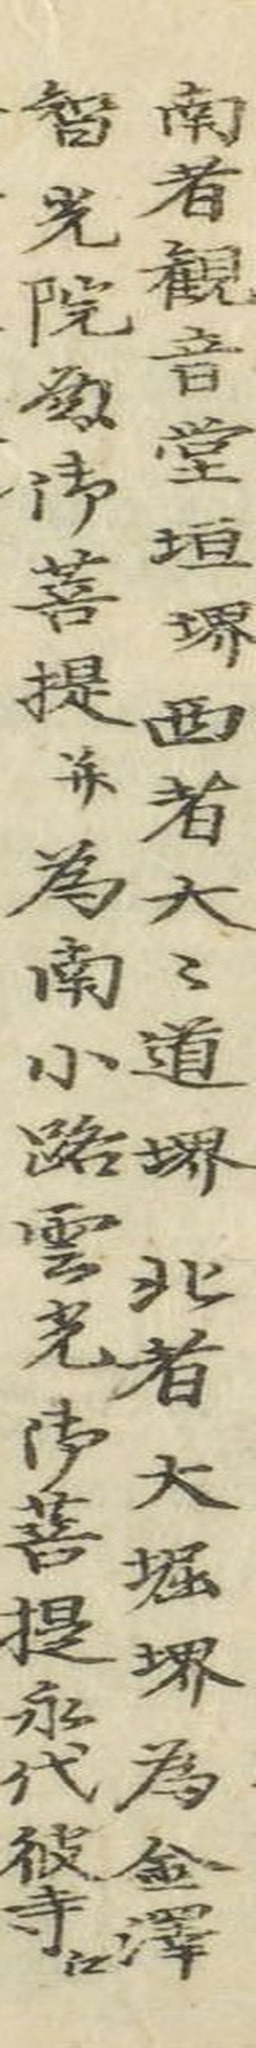智光院殿御菩提幷為南小路雲光御菩提永代彼等江
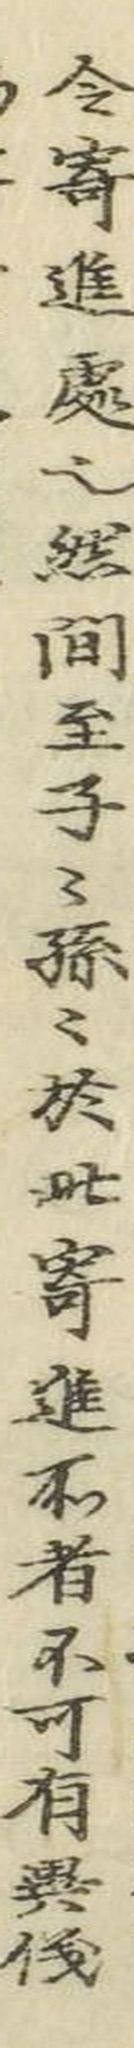令寄進處也然間至子々孫々於此寄進所者不可有異儀
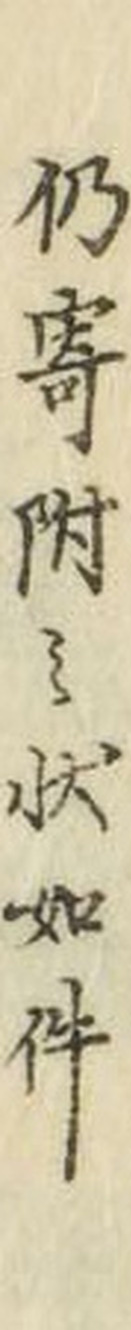仍寄附之状如件
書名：江戸名所図会 20巻 巻之4
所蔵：東京学芸大学教育コンテンツアーカイブ
